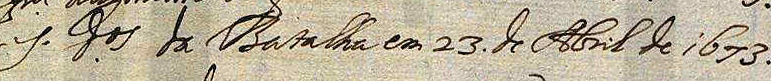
S. d.os da Batalha em 23. de Abril de i673.
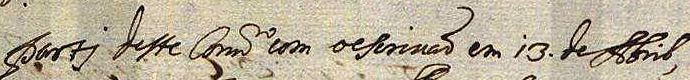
partj deste Conuto com o escriuaõ em i3. de Abril,
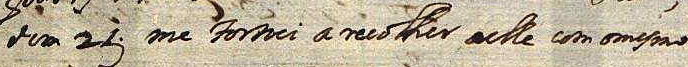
e em 2i me tornei a recolher a elle com o mesmo
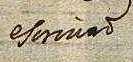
escriuaõ.
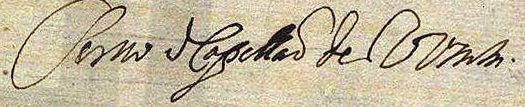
Seruo e Capellaõ de VV mm.
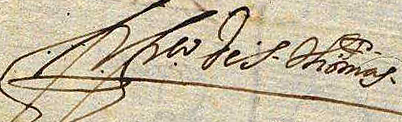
fr frco de s. thomas
